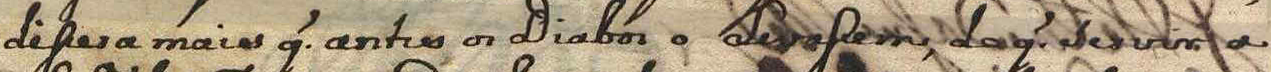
dissera mais q̄ antes os Diabos o Levassem, do q̄ servir a
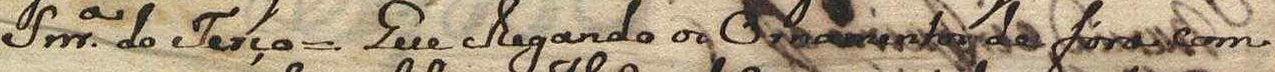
Snr.a do Terço= Que chegando os Ornamentos de fóra com
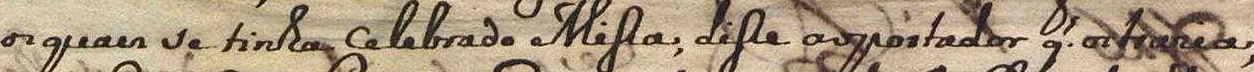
os quaes se tinha celebrado Missa, disse ao portador q̄ os trazia,
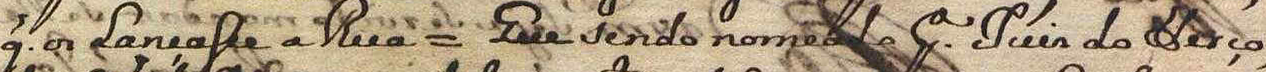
q̄ os Lançasse a Rua= Que sendo nomeado p.a Iuis do Terço,
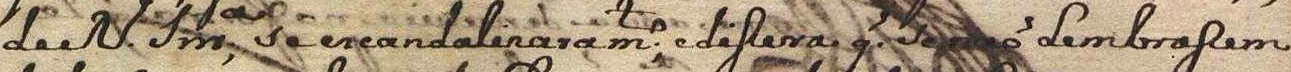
de N. Snra; se escandalizara m.to, e disera q̄ se naõ Lembrassem
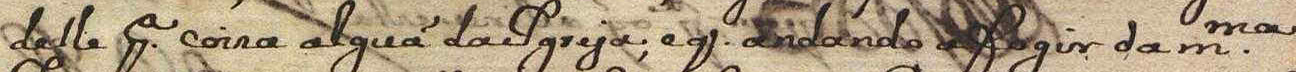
delle p.a coisa alguā da Igreja; e q. andando a fogir da m.ma
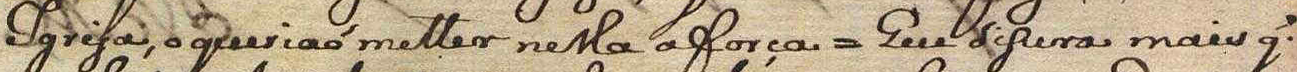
Igreja, o queriaõ metter nella a força= Que dissera mais q̄
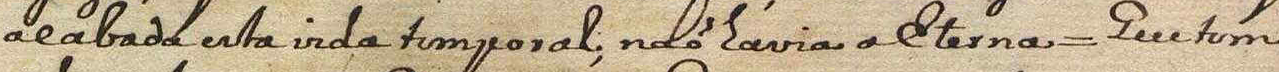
acabada esta vida temporal; naõ havia a Eterna= Que tem
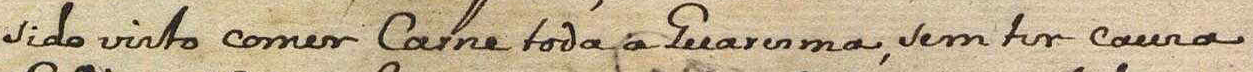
sido visto comer Carne toda a Quaresma, sem ter cauza
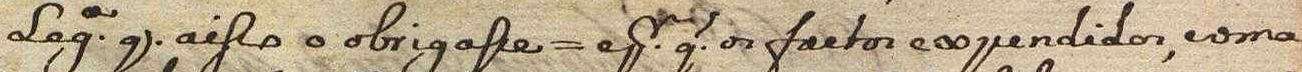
Leg.a q̄ a isso o obrigasse= e p.r q̄ os factos expendidos, e o ma
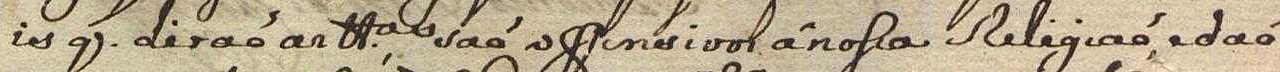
is q̄ diraõ as tt.as, saõ offensivos á nossa Religiaõ, e daõ
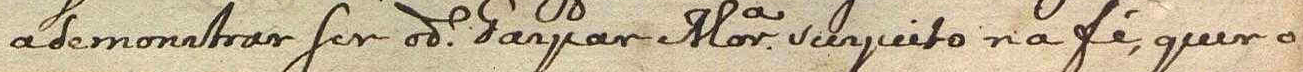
a demonstrar ser o d.o Gaspar Mor.a suspeito na fé, quer o
